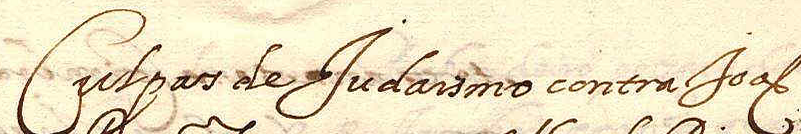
Culpas de Judaismo contra Joaõ
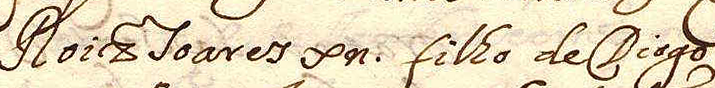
Roiz̄ Soares xn. filho de Diogo
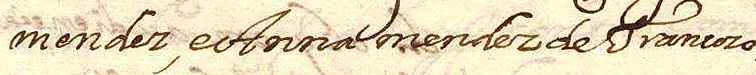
mendez, e Anna mendez de Trancozo.
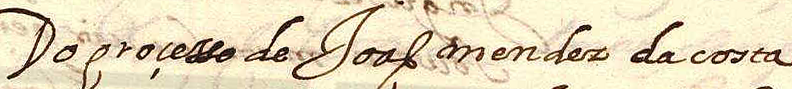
Do proçesso de João mendez da costa
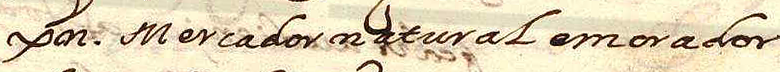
xn. Mercador naturaL e morador
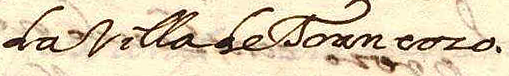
da villa de Trancozo.
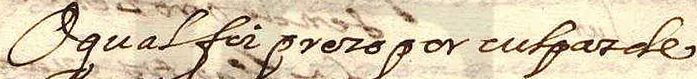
O quaL foi prezo por culpas de
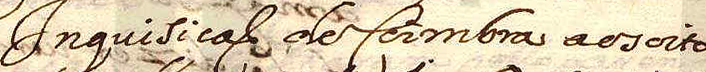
Inquisiçaõ de Coimbra aos oito
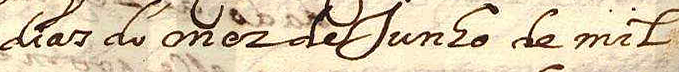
dias do mez de Junho de miL
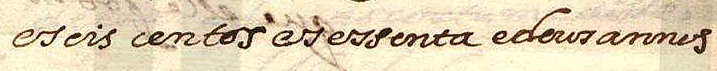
e seiscentos e sessenta e dous annos
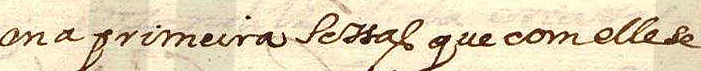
e na primeira sessaõ que com elle se
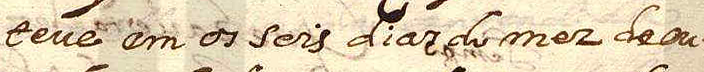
teue em os seis dias do mez de ou
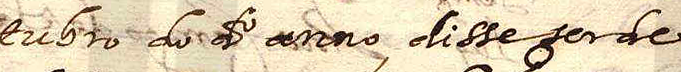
tubro do d̄o anno, disse ser de
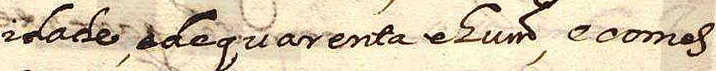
idade, _ de quarenta e hum̄, e comes
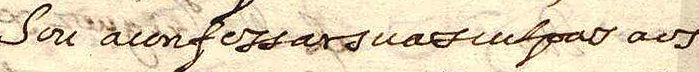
sou a confessar suas culpas aos
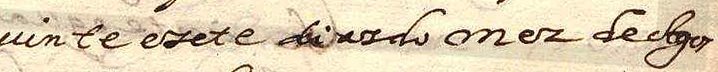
uinte e sete dias do mez de Agos
